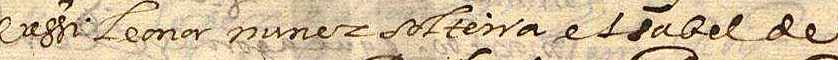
e ass̄i Leonor nunez solteira e Isabel de
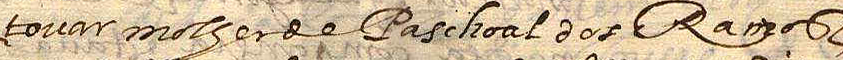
touar molher de Paschoal dos Ramos
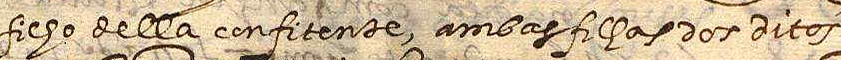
filho della confitente, ambas filhas dos ditos
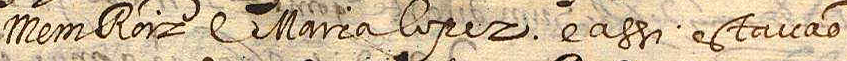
mem Rōiz e Maria lopez. e assi estauaõ
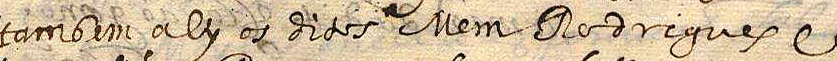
tambem aly os ditos Mem Rodrigues e
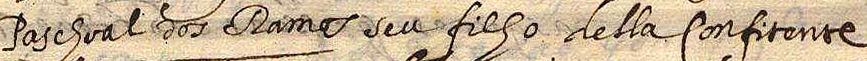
Paschoal dos Ramos seu filho della Confitente
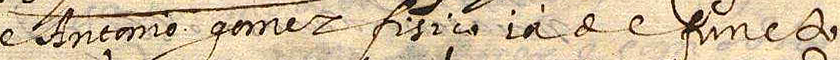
e Antonio gomez fisico iá defuncto
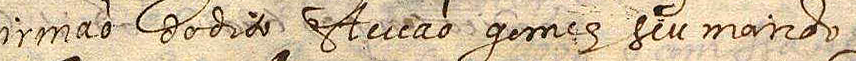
irmaõ do dito esteuaõ gomez seu marido
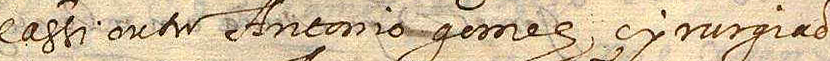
e ass̄i outro Antonio gomes cyrurgiaõ
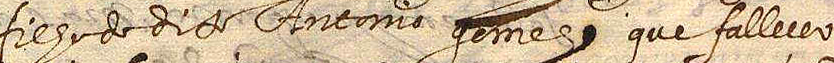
filho do dito Antonio gomes que falleceo
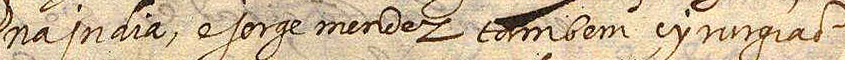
na jndia, e jorge mendez tambem cyrurgiaõ
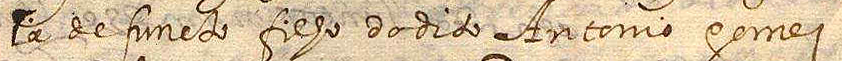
ia defuncto filho do dito Antonio gomez
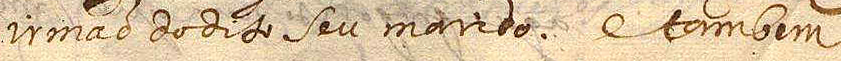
irmaõ do dito seu marido e tambem
